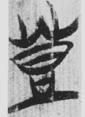○（登）
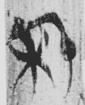年
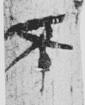不
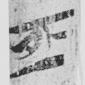亙（恆）
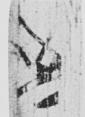至
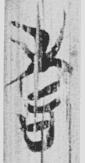耇
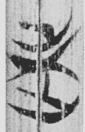老
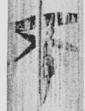不
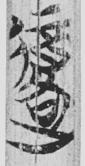復
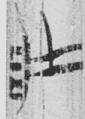壯
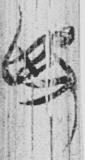○（賢）
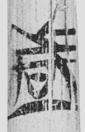者
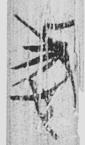忣
